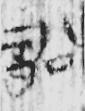訟
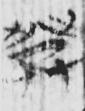登
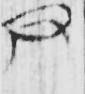尹
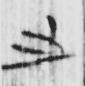之
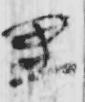里
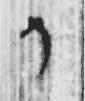人
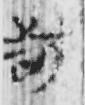苛
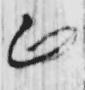㠯（以）
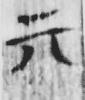亓（其）
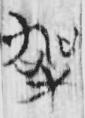桑（喪）
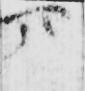亓（其）
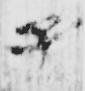子
